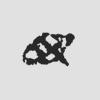取
